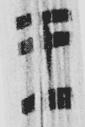王
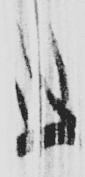之
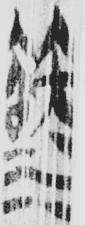灋（法）
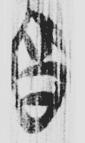高
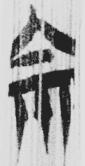宗
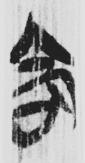命
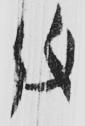○（傅）
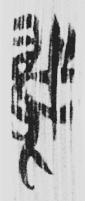鳶（說）
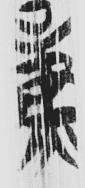量
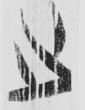之
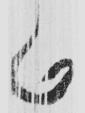㠯（以）
